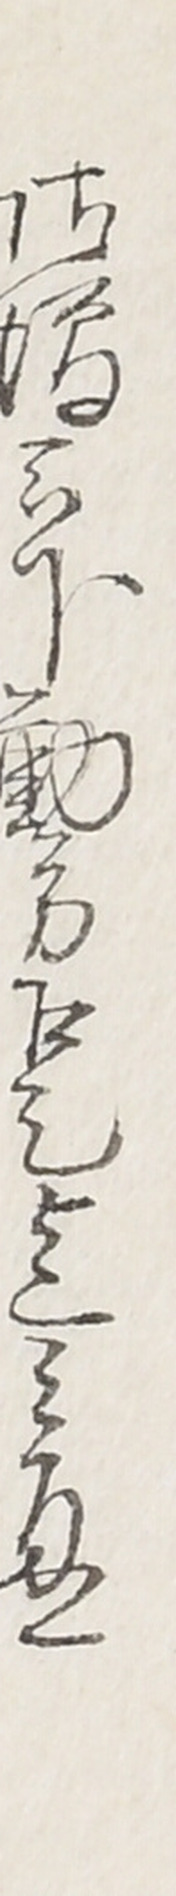御増被下勤方是迄之通
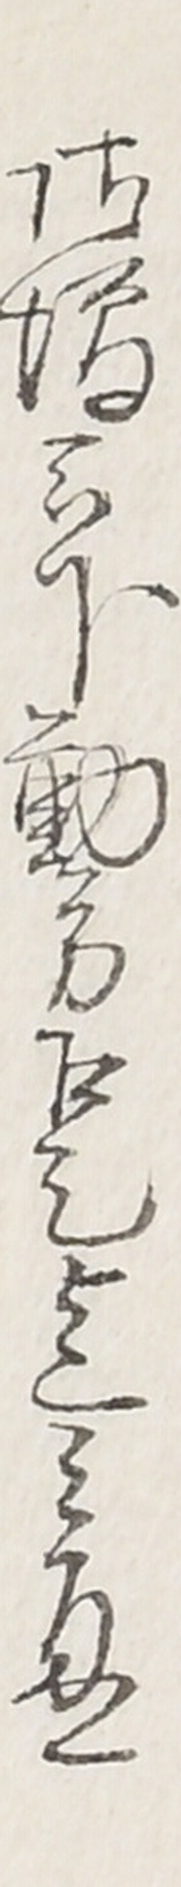御増被下勤方是迄之通
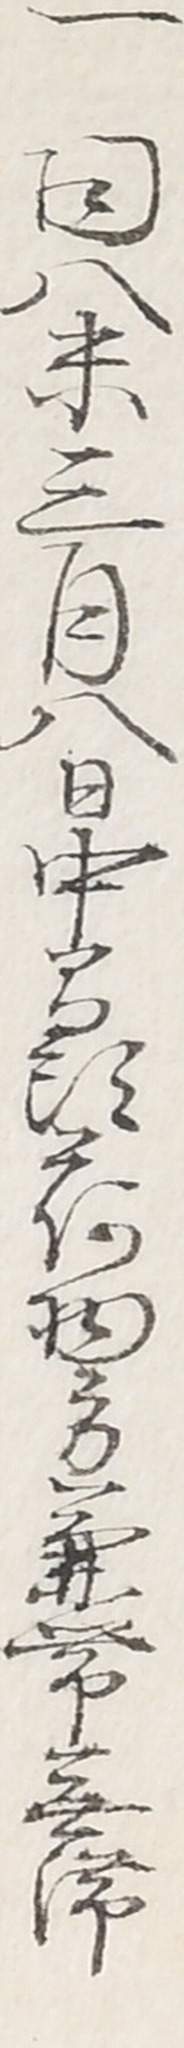一同八未三月八日中間頭荷物方兼帯無滞
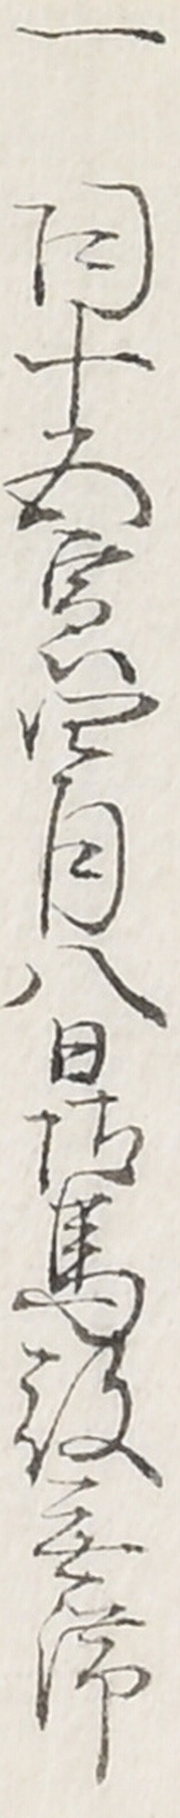一同十五寅四月八日御馬役無滞
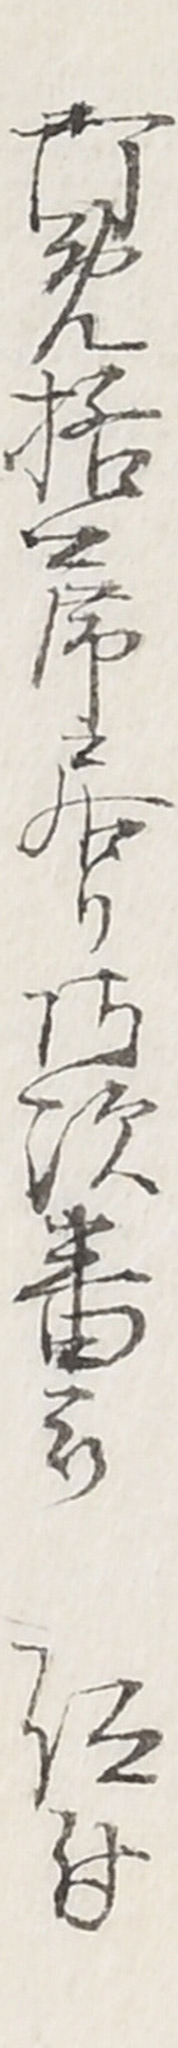御免格席居リ御次番被仰付
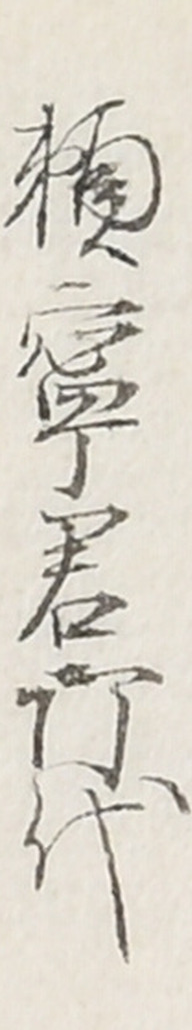頼寧君御代
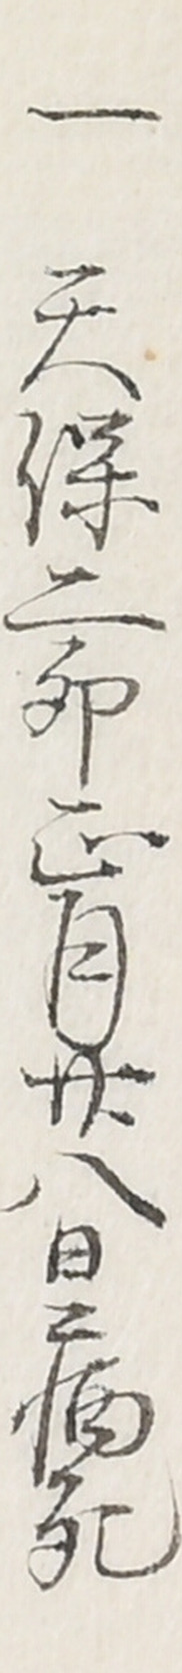一天保二卯正月廿八日病死
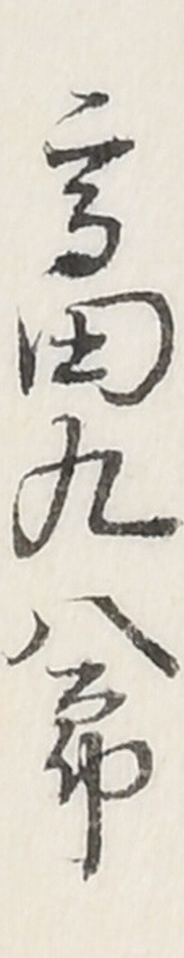高田九八郎
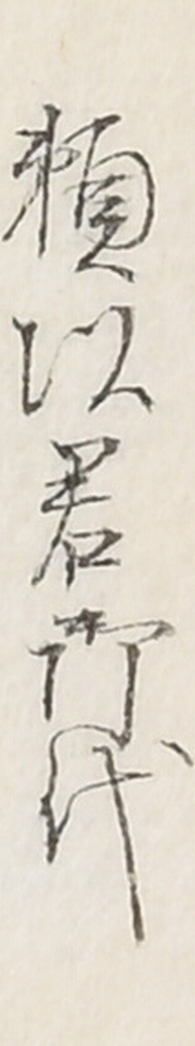頼以君御代
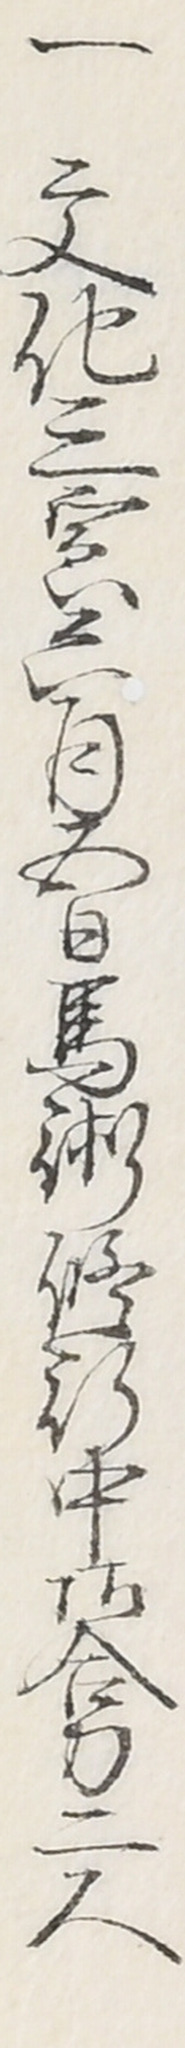一文化三寅六月五日馬術修行中御合力二人
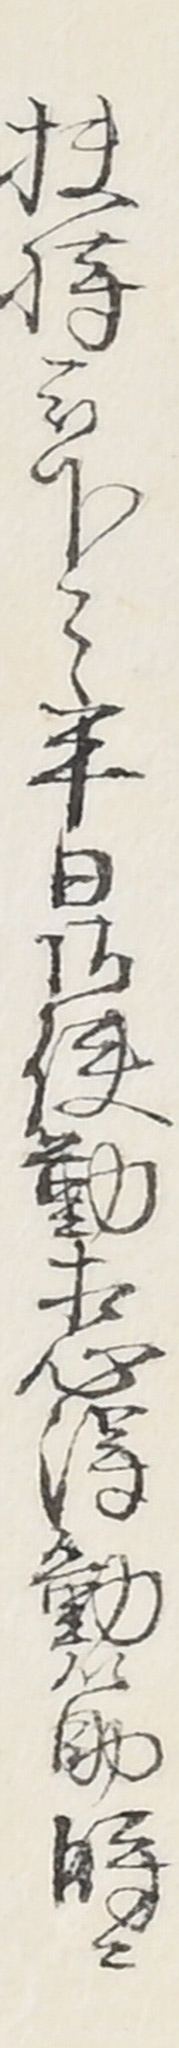扶持被下之半日御使勤相心得勤筋時ニ
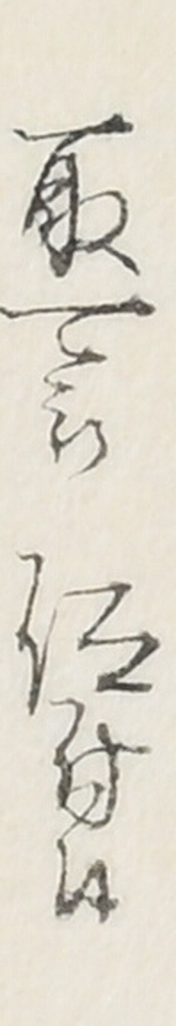取可被仰付候
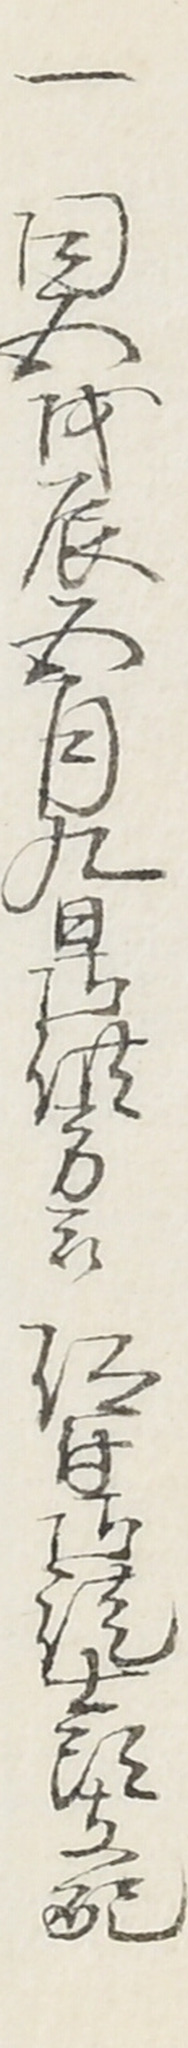一同五戊辰五月九日御供方被仰付御徒士頭支配
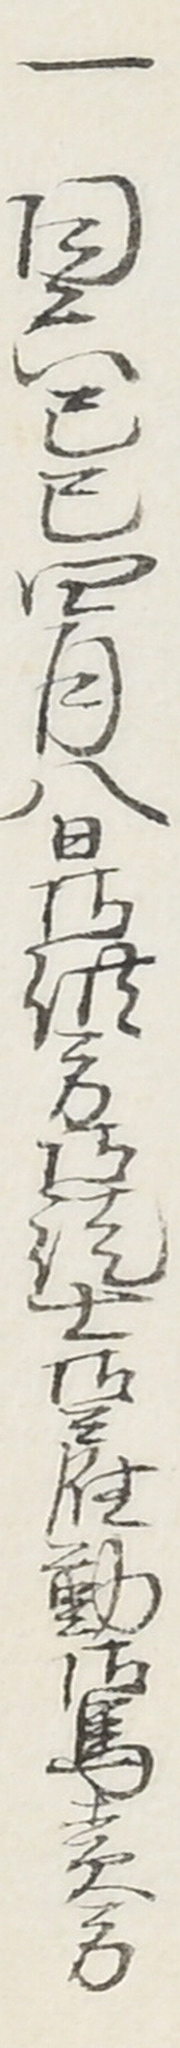一同六己巳四月八日御供方御徒士御雇勤御馬責方
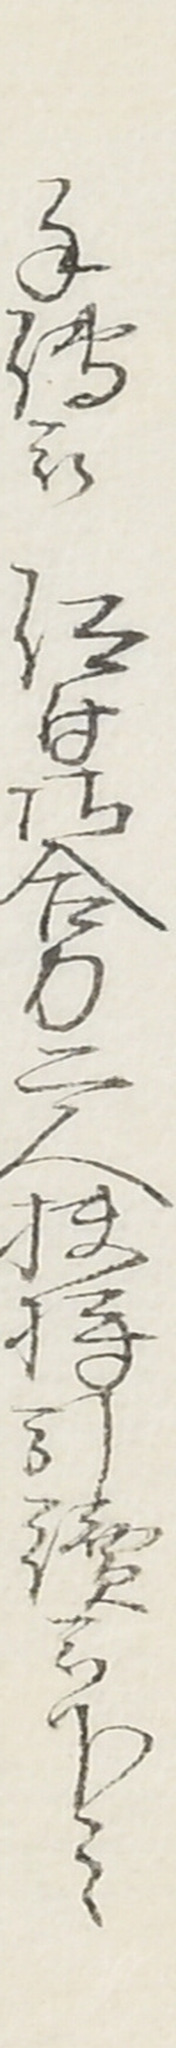手伝被仰付御合力二人扶持引続被下之
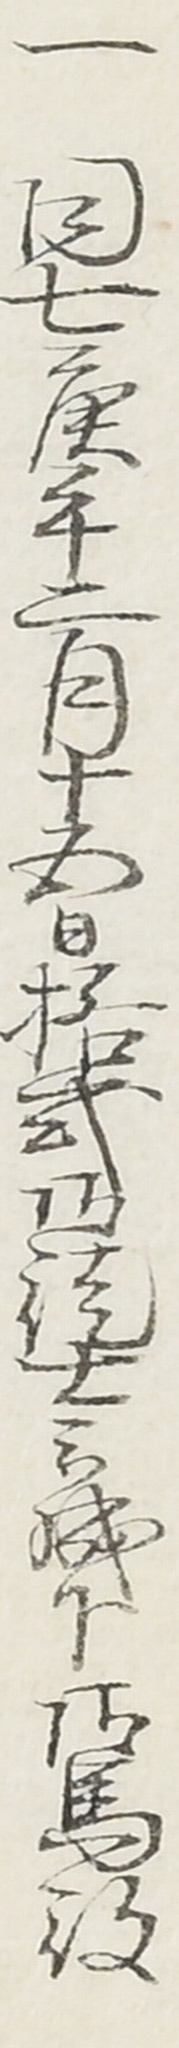一同七庚午二月十五日格式御徒士被成下御馬役
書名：無足諸士勤仕録（四）
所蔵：伊那市立高遠町図書館・合同会社AMANE
